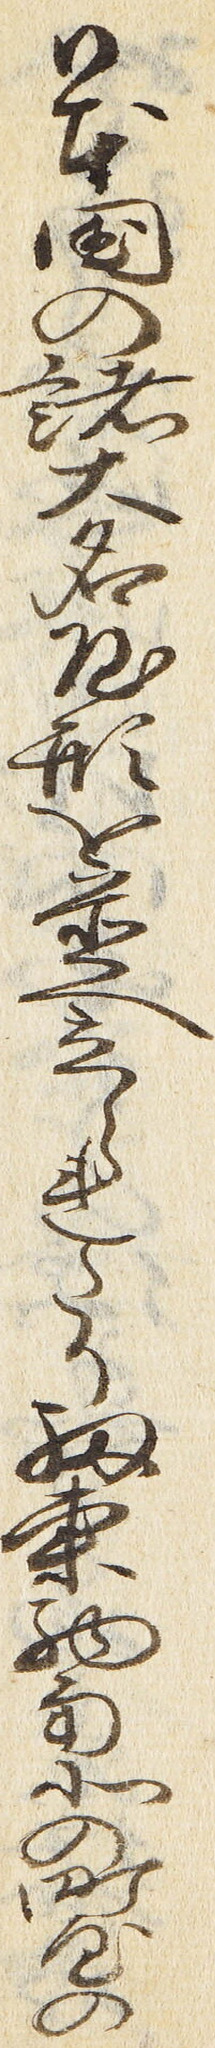日本国の諸大名屋形を並へ立られたり扨東西南北の町屋の
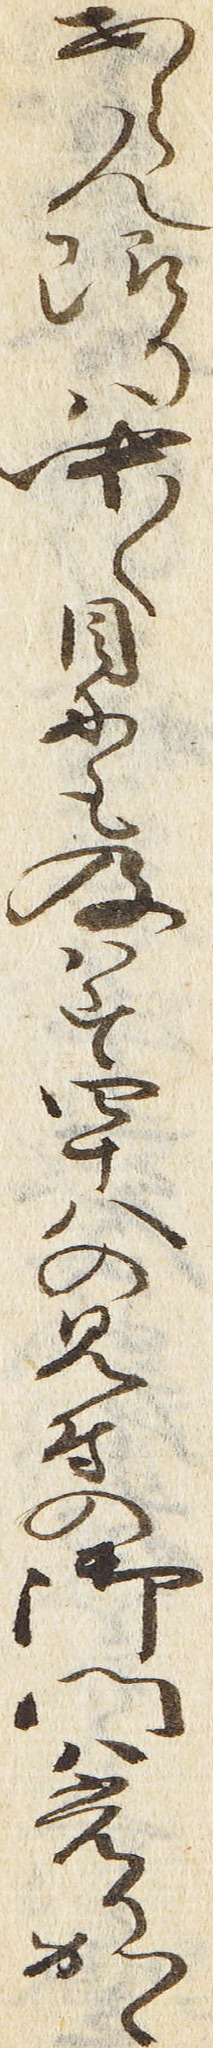あらん限りは中〳〵目にも及はす四十八の見付の御門は光りかゝ
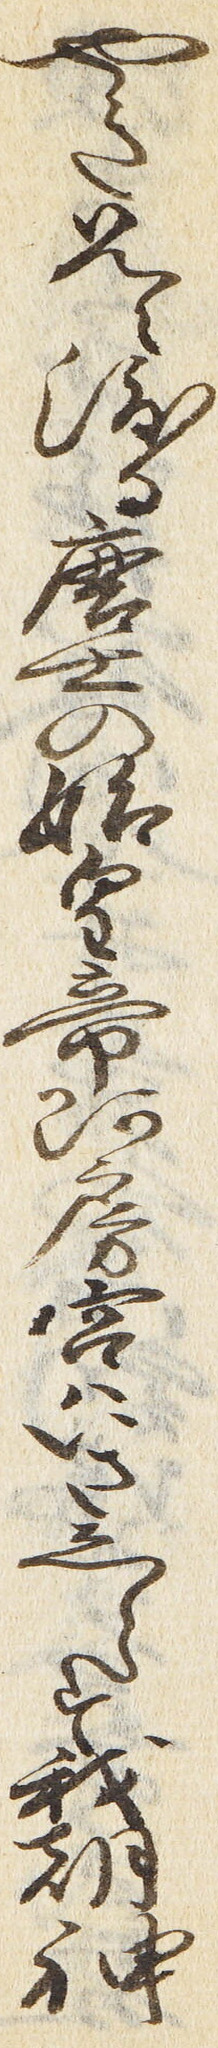やき見え渡る唐土の始皇帝阿房宮はいさしらす我朝神
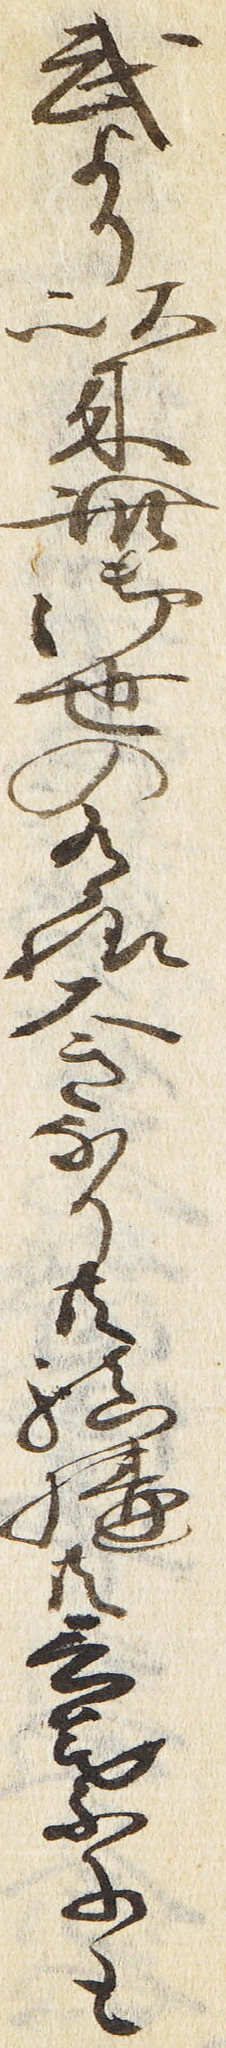武より以来此御世の有様大きなり共結構共言葉にも
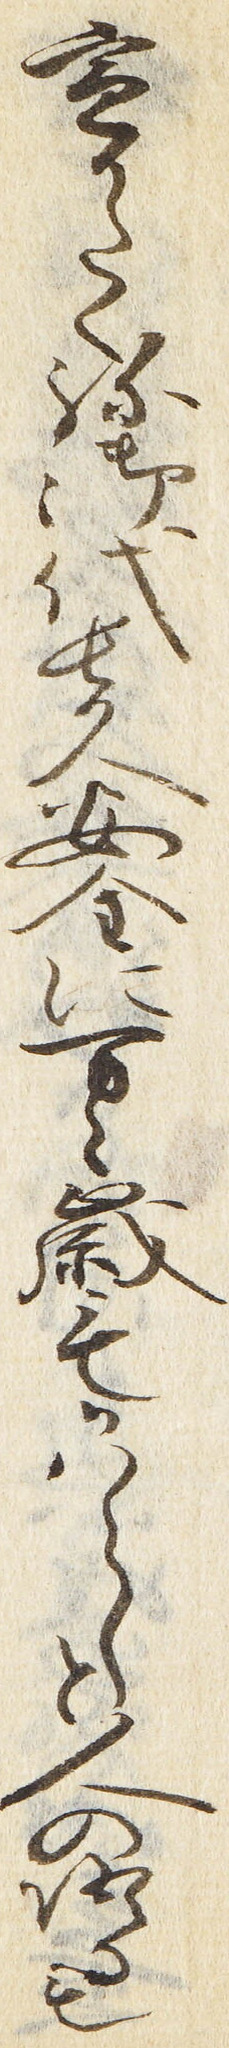尽かたく弥御代長久安全に万々歳もかはらしと人の語るも
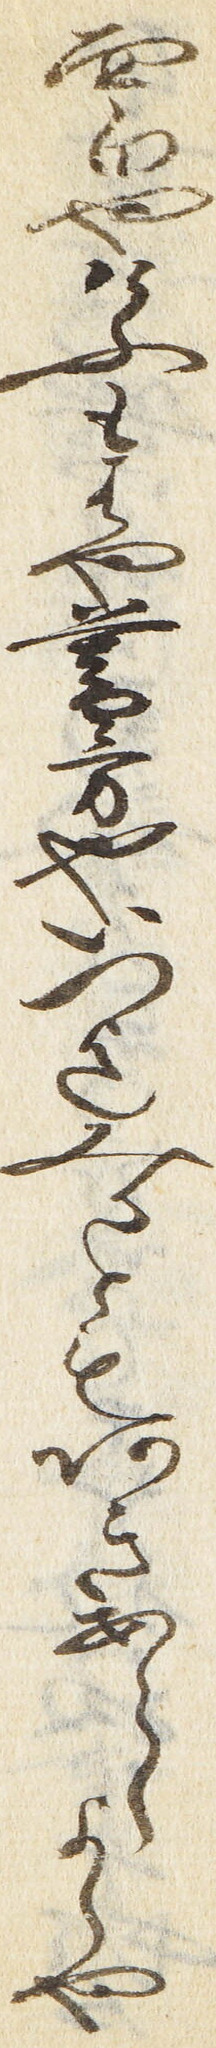面白やけふもはや暮方やいつ迄みるともあきあらしよしや
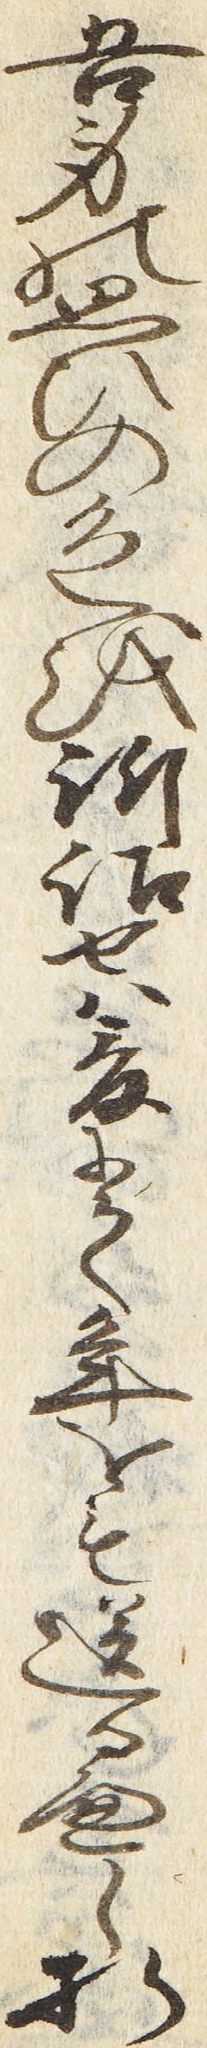吾身の思ひの色を訴訟せは爰にて年をも送るへし折
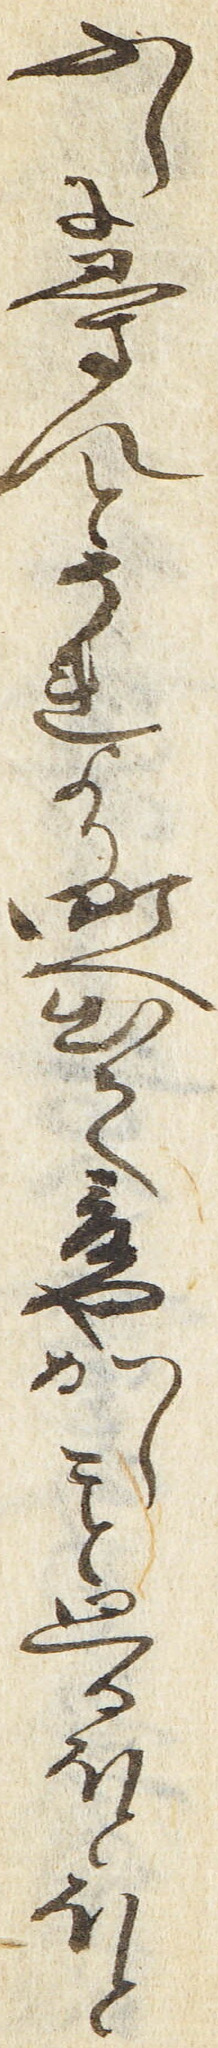ふしに尋んとそれより町へ出て爰やかしこと廻るほとほと
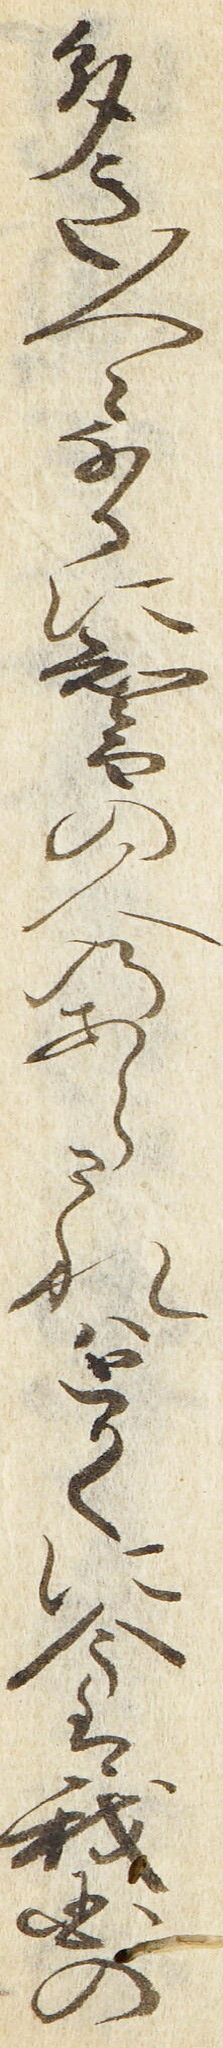多き人々なるに知音の人のあらされはとかくに今は我国の

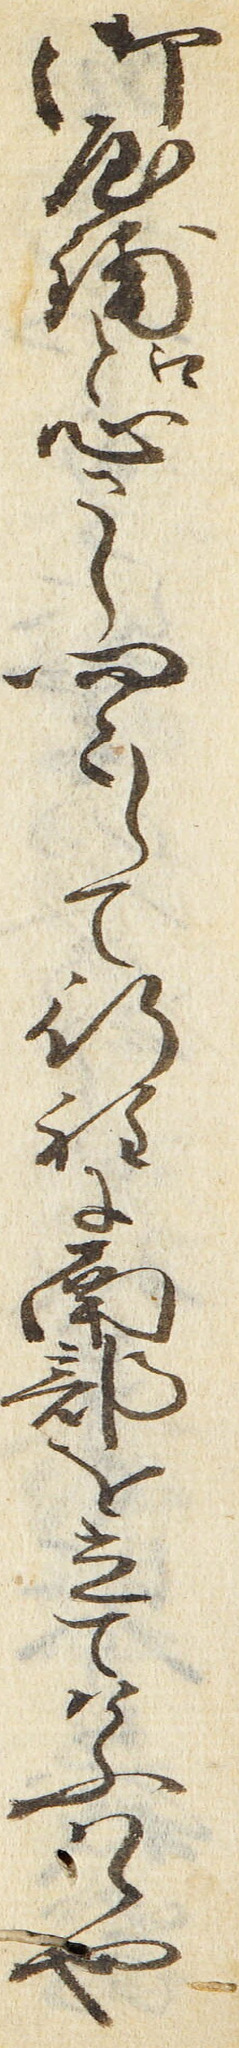御屋鋪えと心さし問々して行程に南部を立てけふはゝや
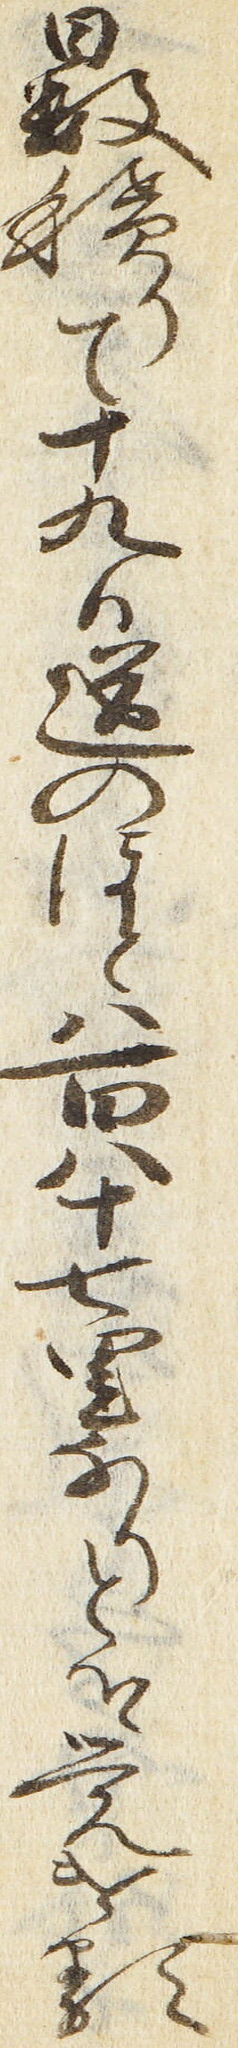日数積りて十九日道のほとは百八十七里なりとそ覚ける
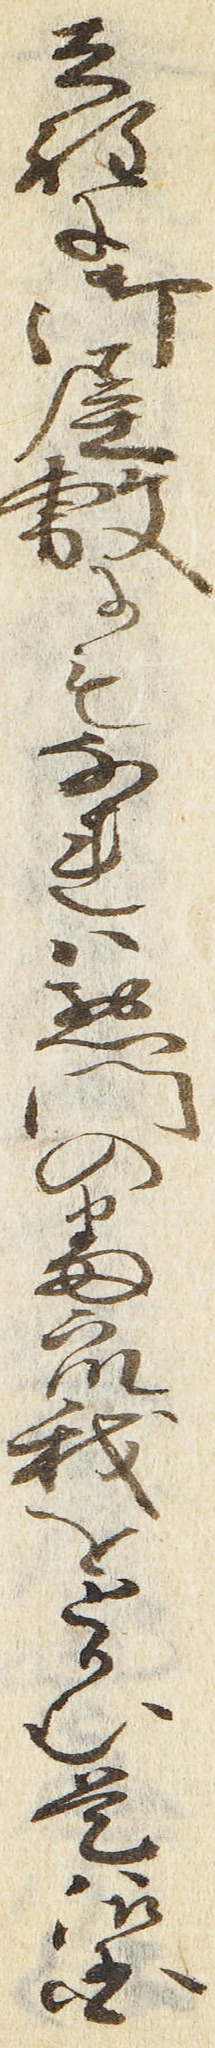去程に御屋敷にもなれは惣門の番衆我をとかむ是は御国
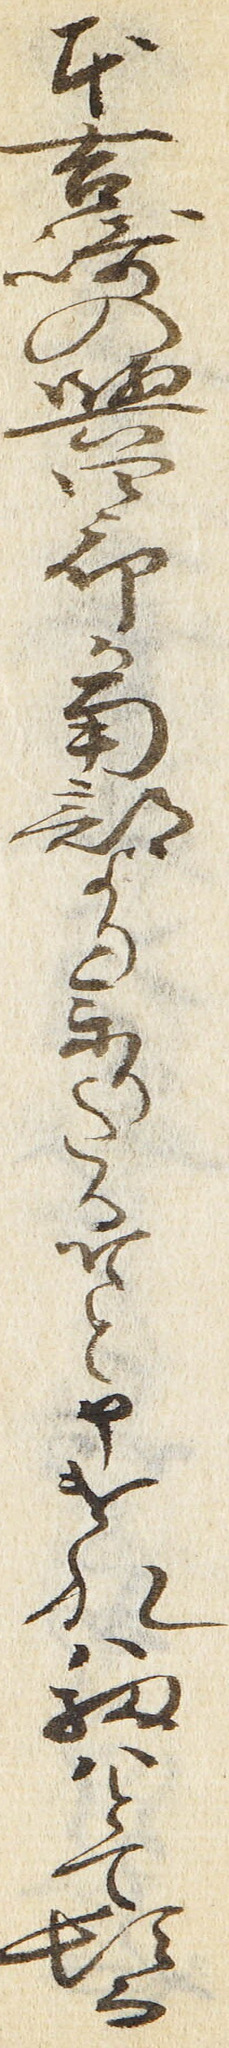本吉崎の与四郎か南部より参りたるそと申けれは扨はとて頓而
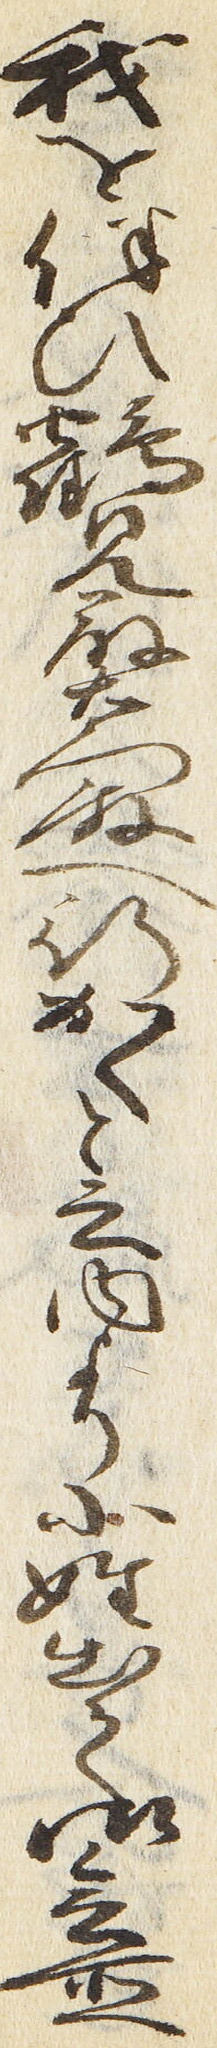我を伴ひ鶴見藤右衛門殿へ行かくと云内より小姓出て御会所へ
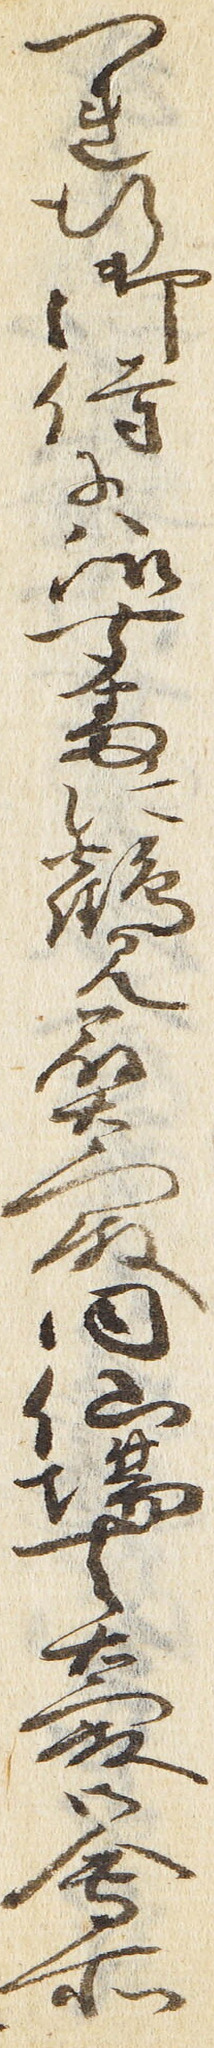つれ行御侍には御聞番に鶴見藤右衛門殿同仙場十郎右衛門殿御会所
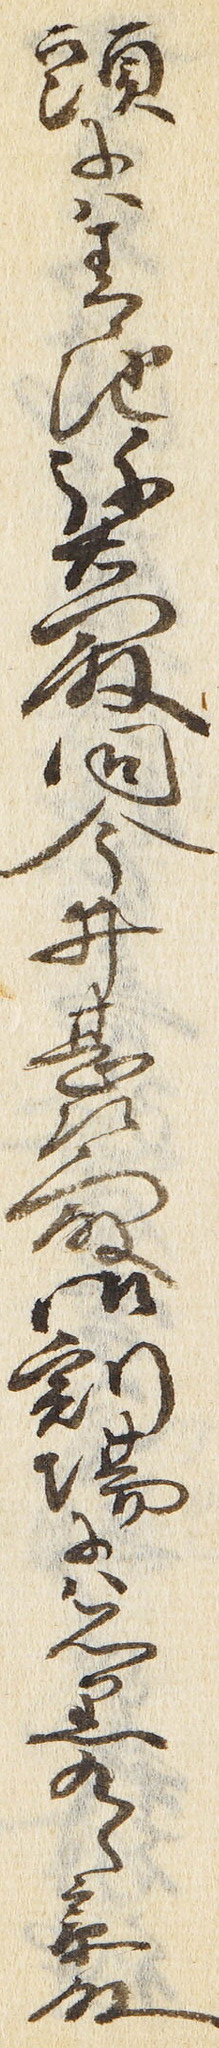頭には青池弥右衛門殿同今井甚左衛門殿御割場には石黒九郎兵衛殿
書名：海陸世話日記
